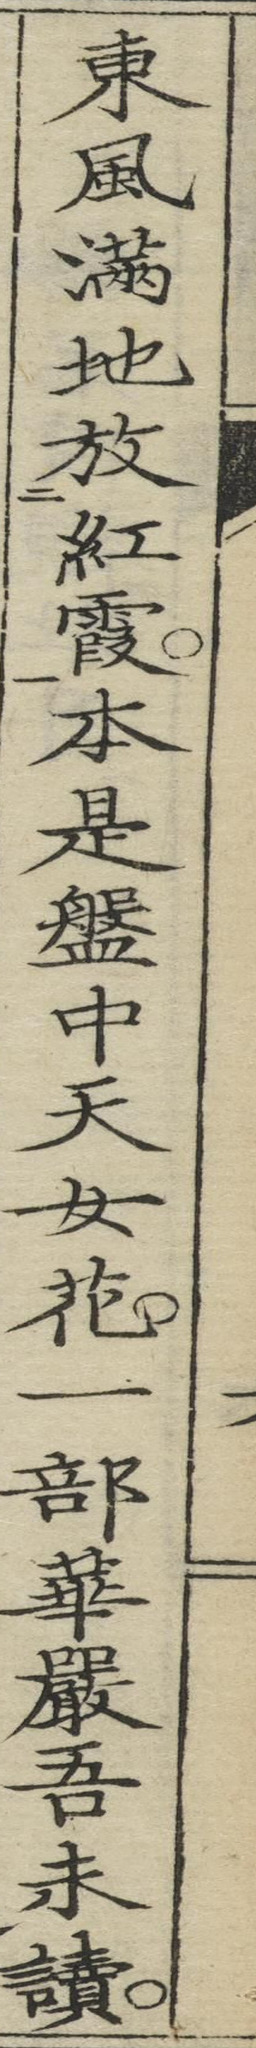東風満地放紅霞本是盤中天女花一部華厳吾未読
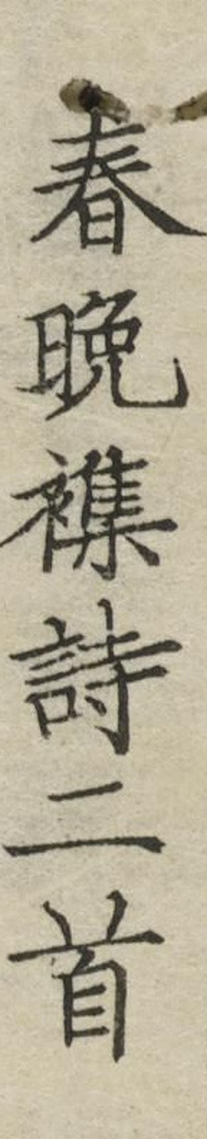春晩樵詩二首
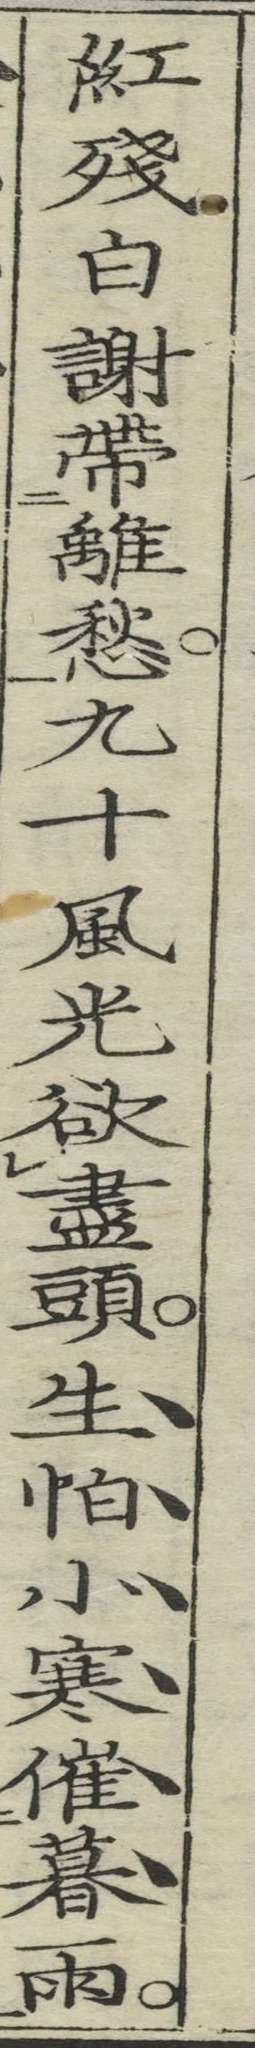紅残白謝帯離愁九十風光欲尽頭生怕小寒催暮雨
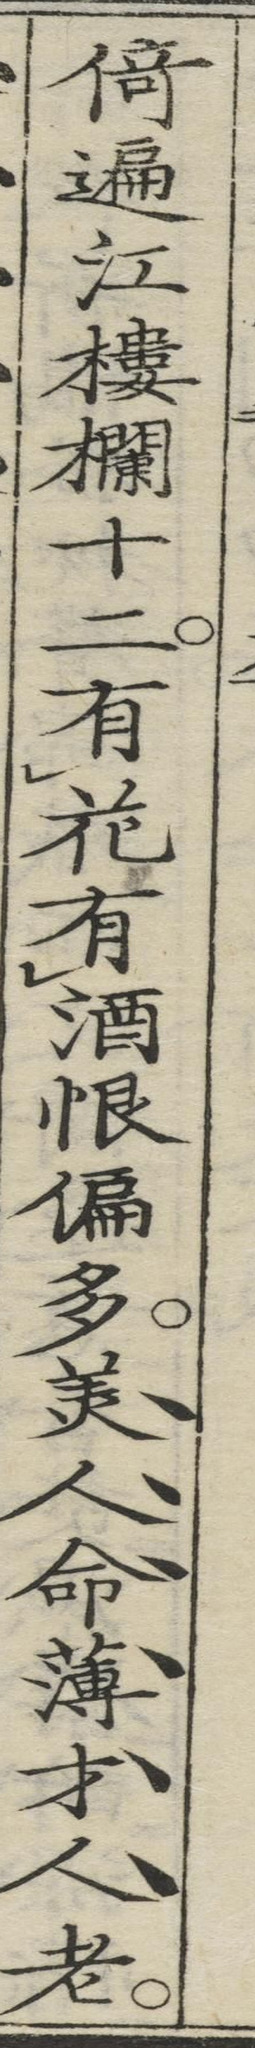倚遍江楼欄十二有花有酒恨偏多美人命薄才人老
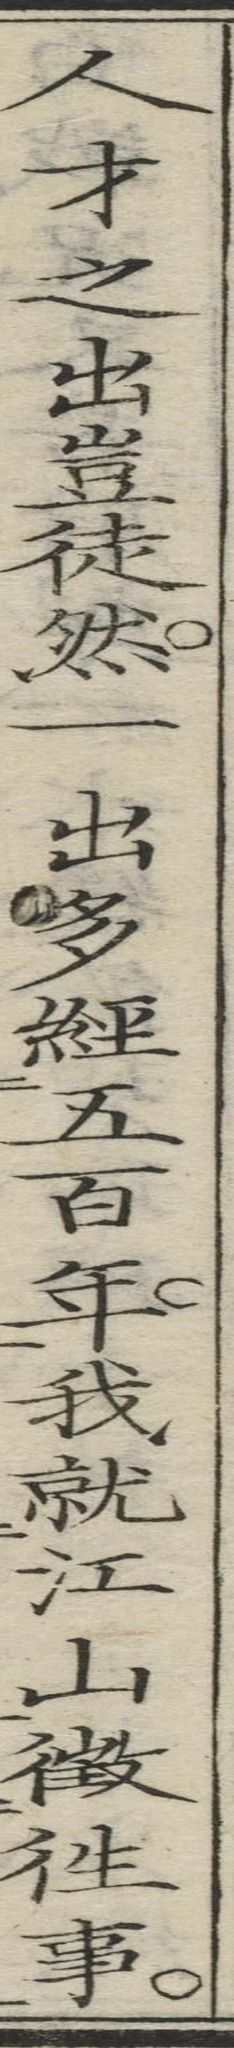人才之出豈徒然一出多経五百年我就江山徴往事
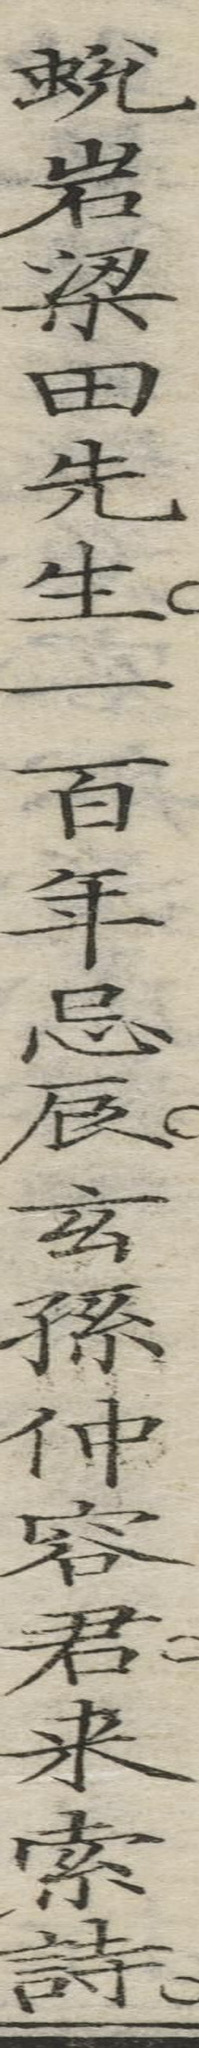蛻岩梁田先生一百年忌辰玄孫仲容君来索詩
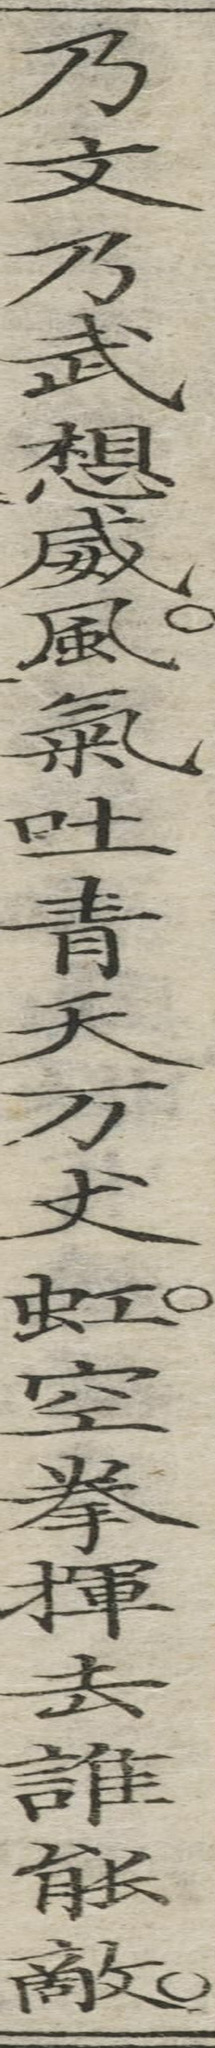乃文乃武想威風気吐青天万丈虹空拳揮去誰能敵
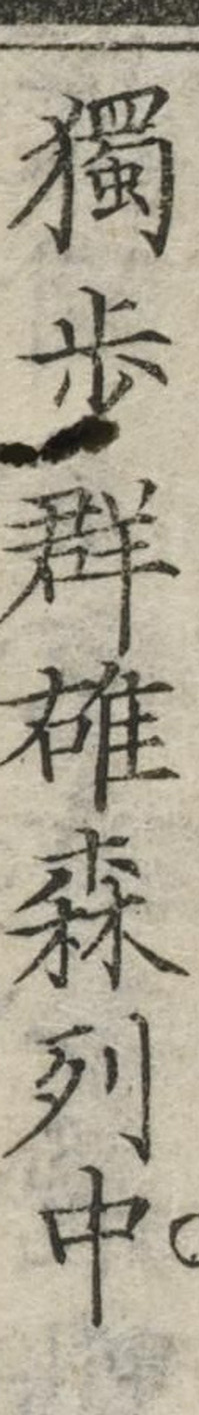独歩群雄森列中
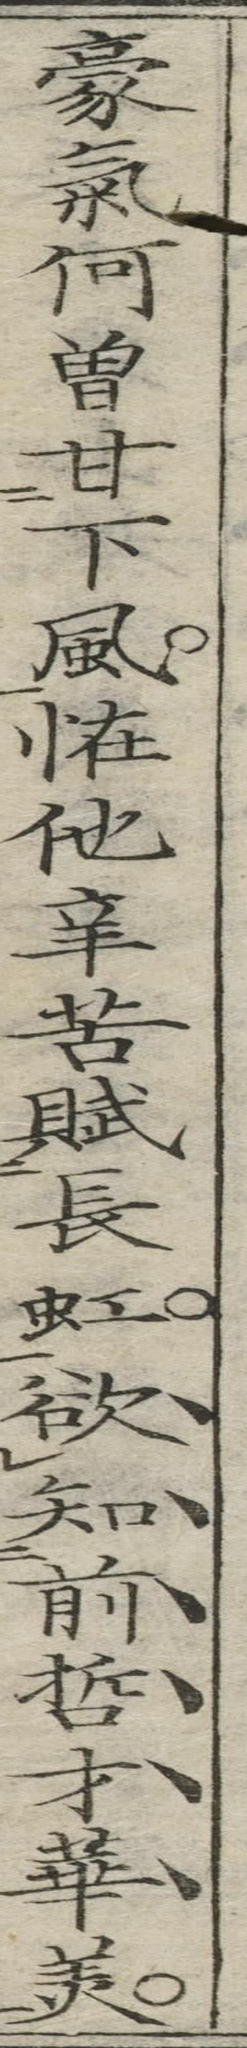豪気何曽甘下風怪他辛苦賦長虹欲知前哲才華美

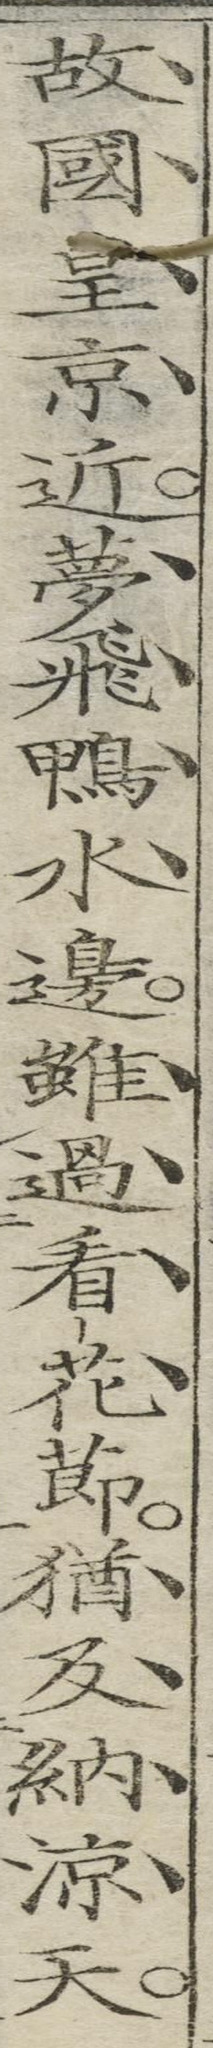故国皇京近夢飛鴨水辺雖過看-花節猶及納涼天
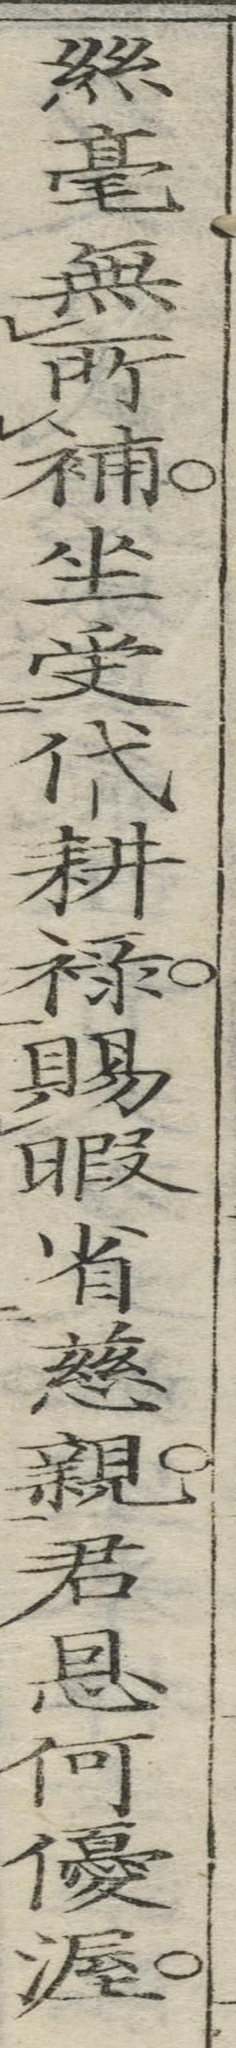糸毫無所補坐受代-耕禄賜暇省慈親君恩何優渥
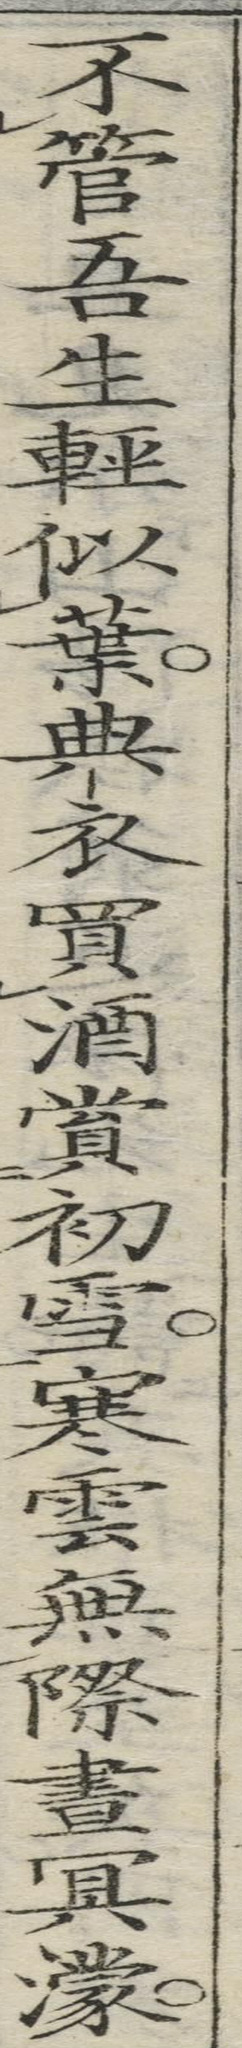不管吾生軽似葉典-衣買酒賞初雪寒雲無際昼冥濛
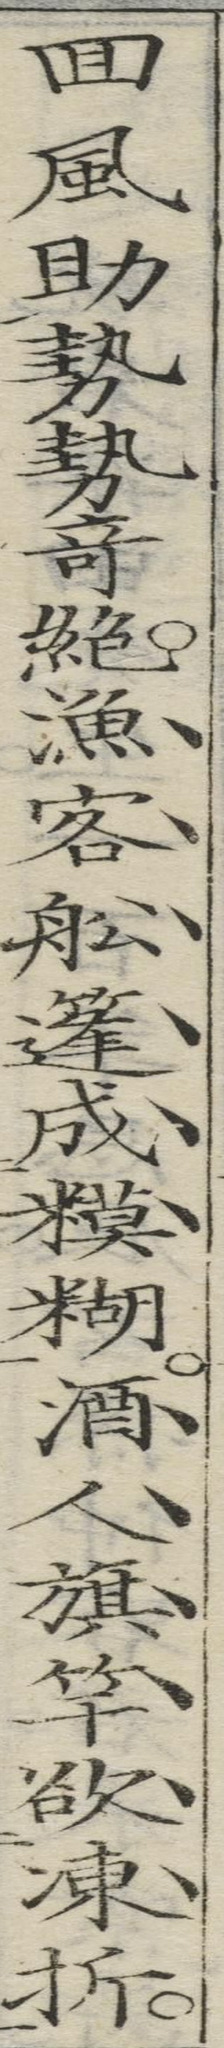回風助勢勢奇絶漁客船篷成模糊○酒人旗竿欲凍折
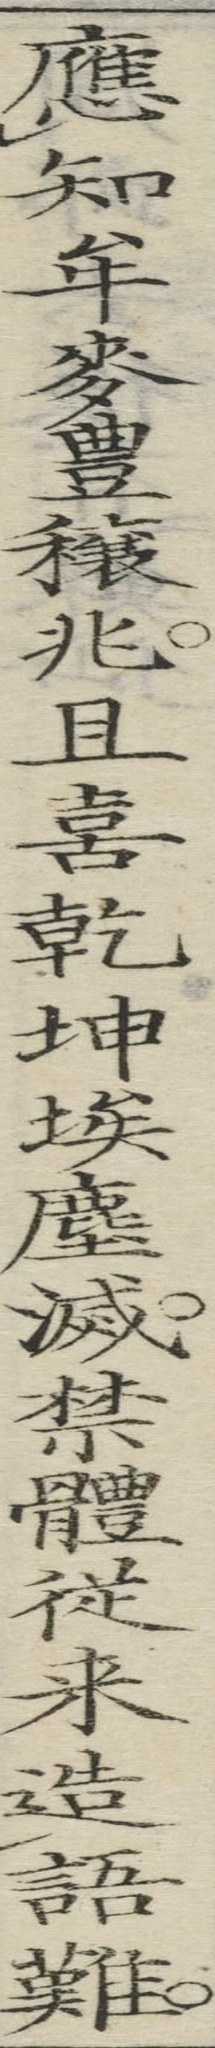応知牟麦豊穣兆且喜乾坤埃塵滅禁体従来造語難
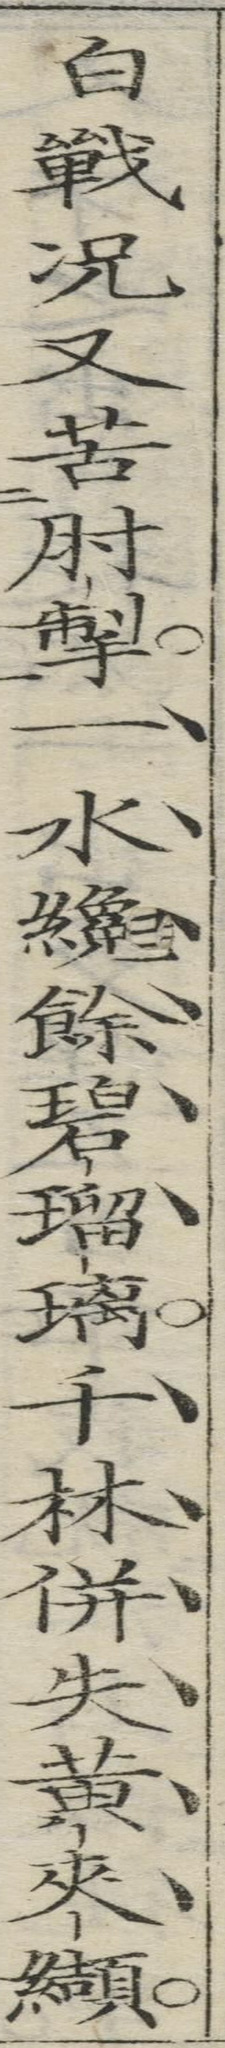白戦況又苦肘-掣一水纔餘碧-瑠-璃千林併失黄-夾-纈
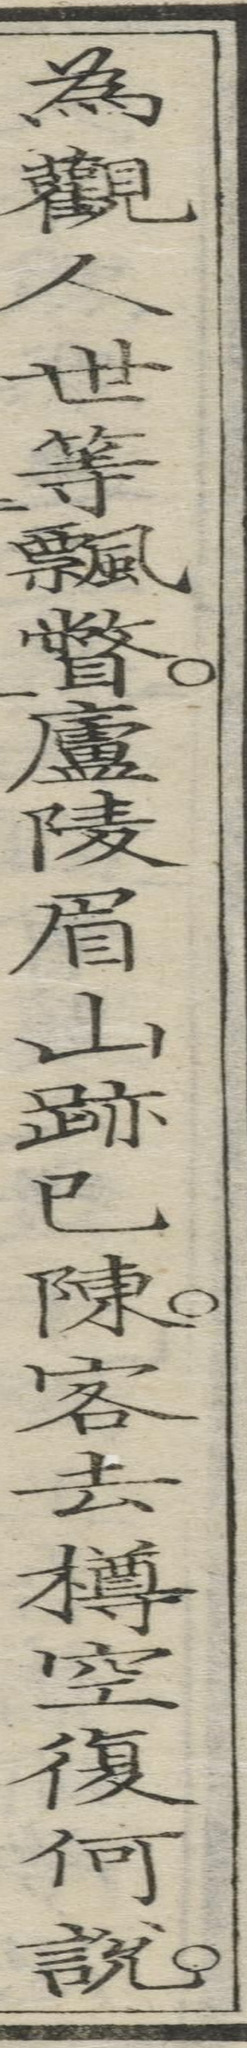為観人世等飄瞥蘆陵眉山跡已陳客去樽空復何説
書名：火後憶得詩
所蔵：東京大学地震研究所図書室 Earthquake Research Institute Library, The University of Tokyo, JAPAN
